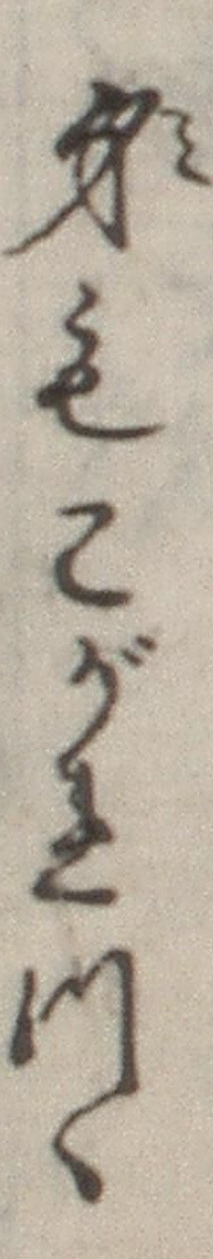身もこがれつゝ

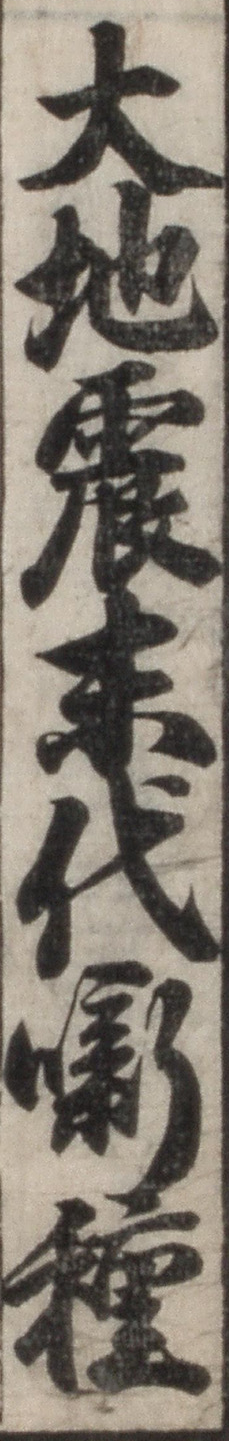大地震末代噺種
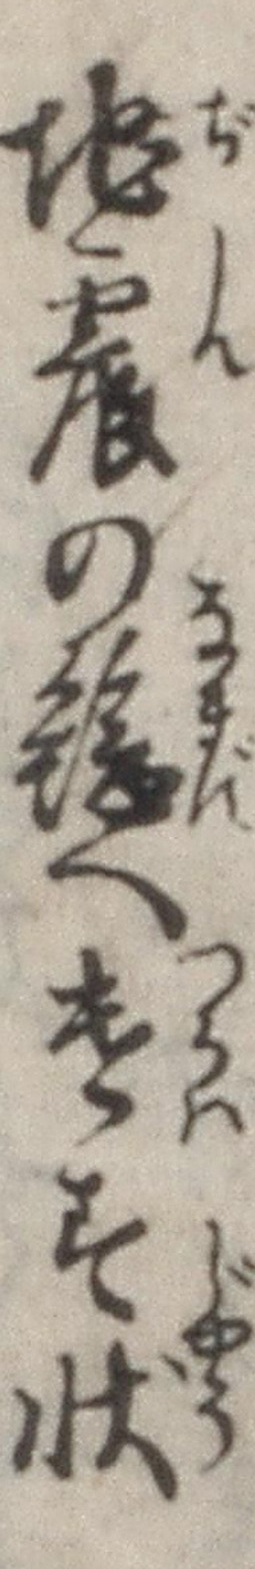地震の鯰へ遣す状
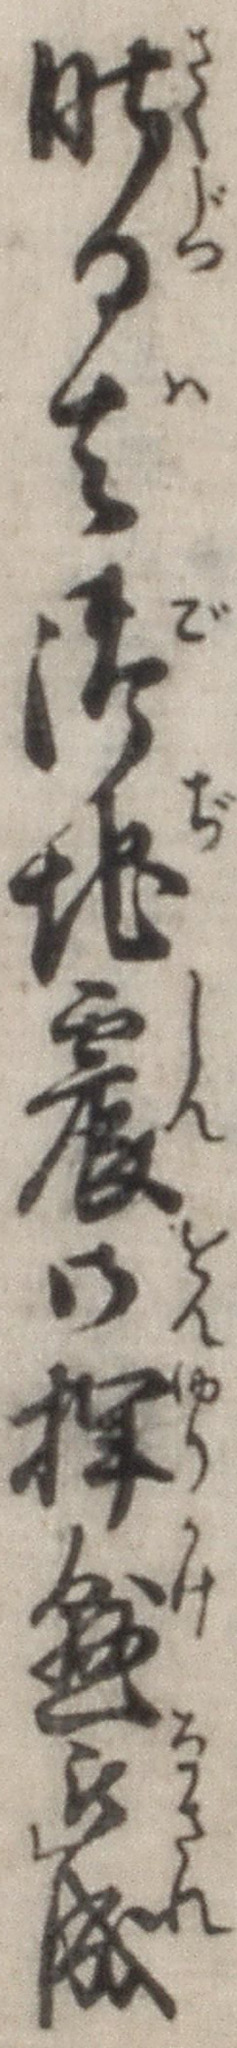昨日者御地震御揮懸被成
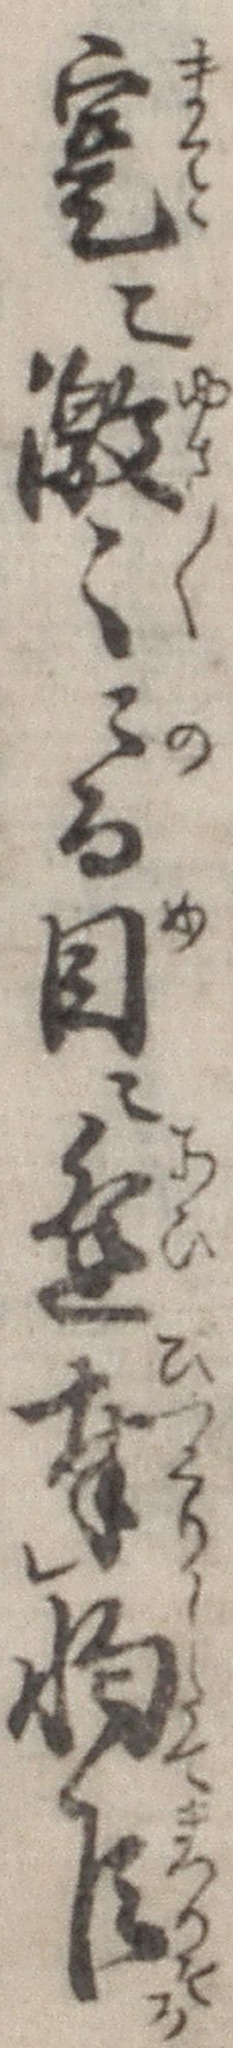寔に激〻二而目に逢奉怐候
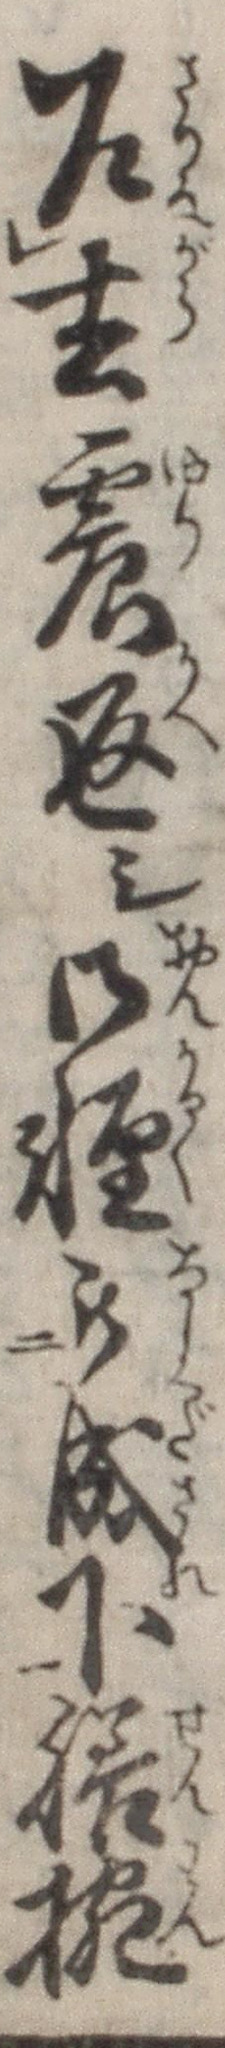乍去震返し御軽被成下膳椀
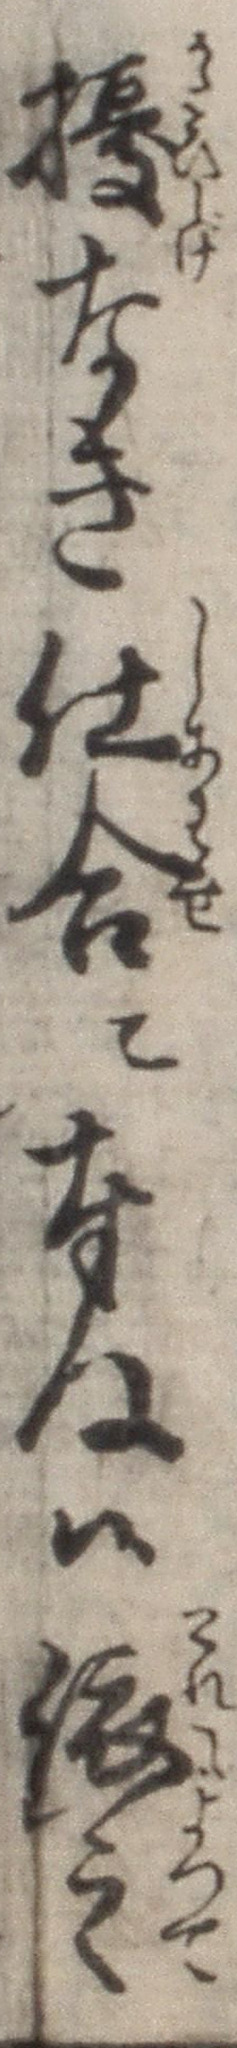擾なき仕合に奉存候依之
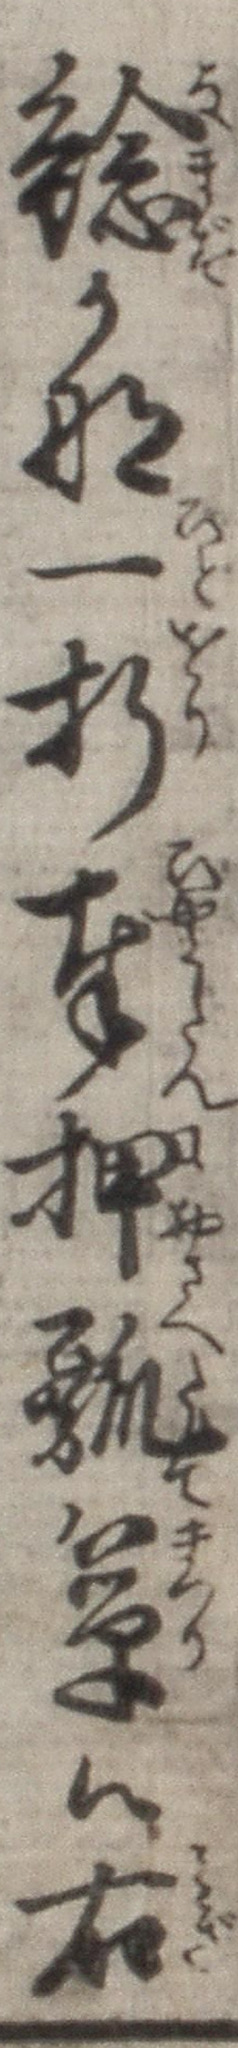鯰かな一折奉押瓢箪候右
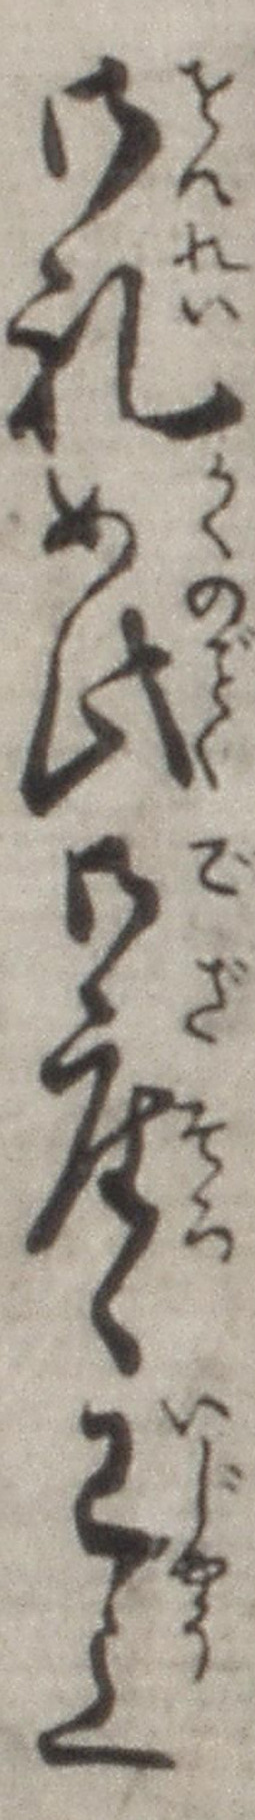御礼如此御座候已上
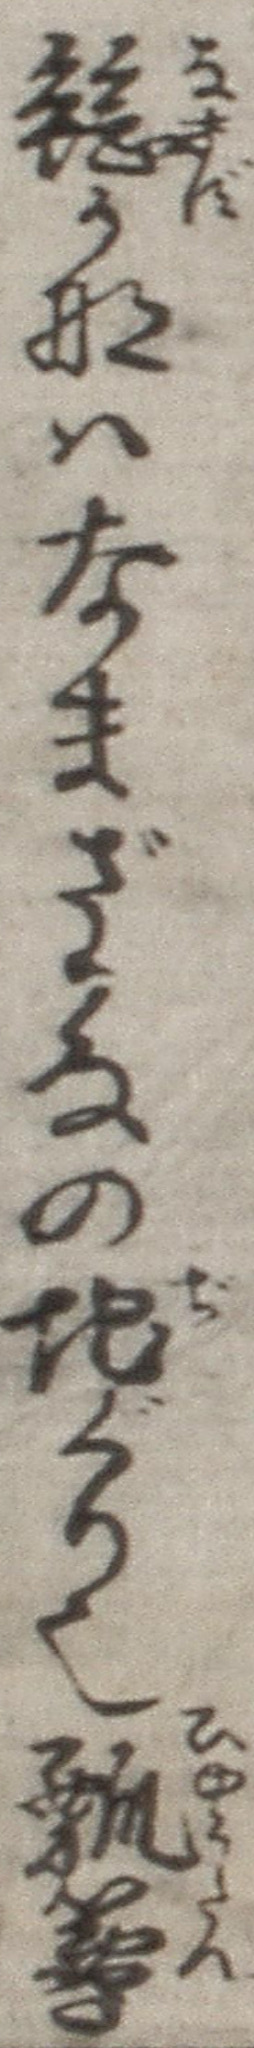鯰かなはなまざかなの地ぐり也瓢箪
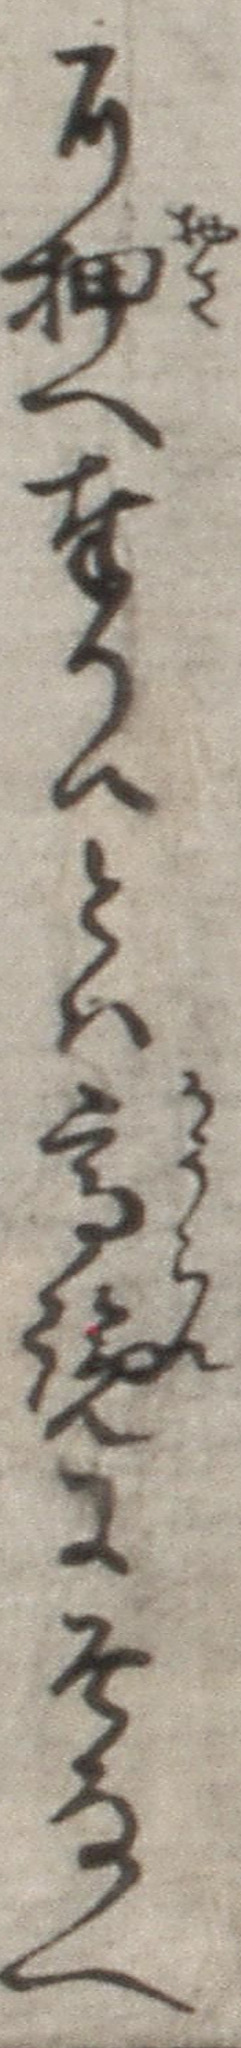に押へ奉り候とは高覧にそなへ
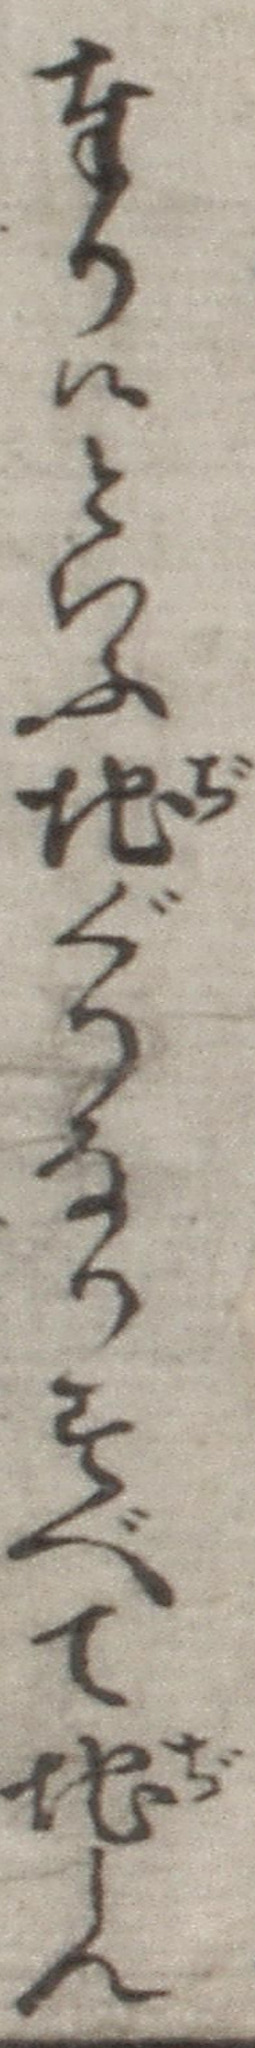奉り候といふ地ぐりなりすべて地しん
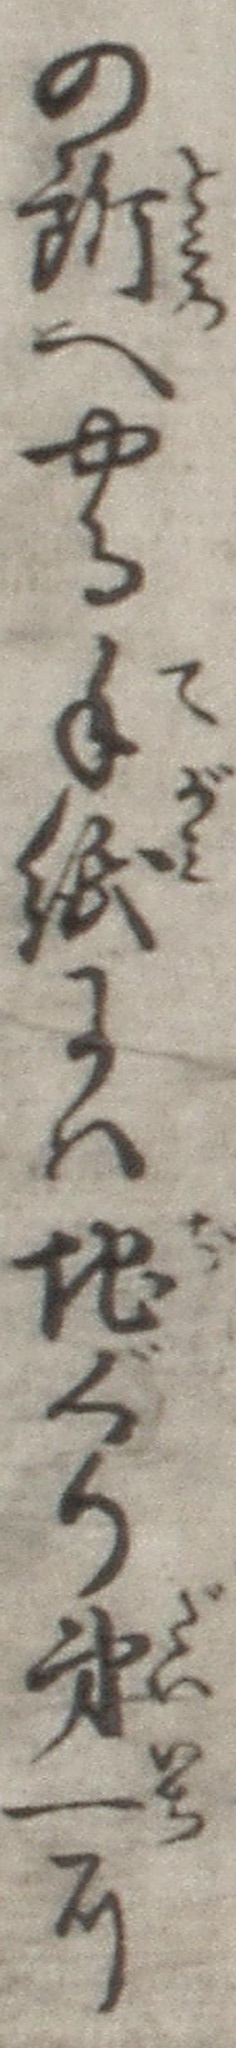の所へやる手紙には地ぐり第一に
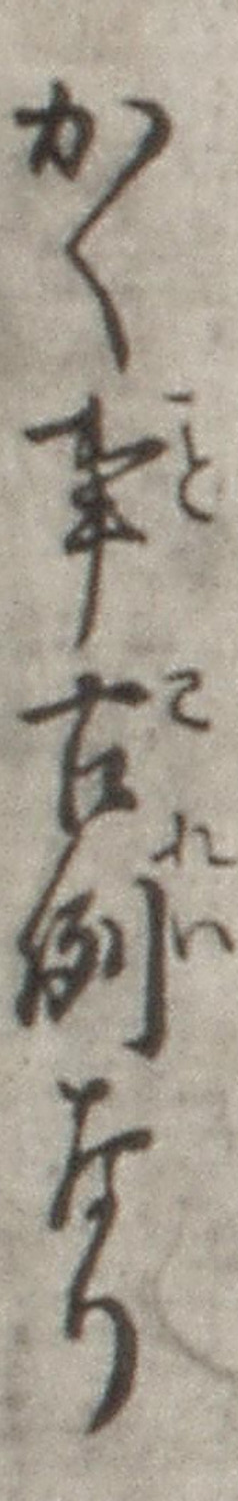かく事古例なり
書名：諸國大地震年代記　末代噺種
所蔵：東京大学地震研究所図書室 Earthquake Research Institute Library, The University of Tokyo, JAPAN
